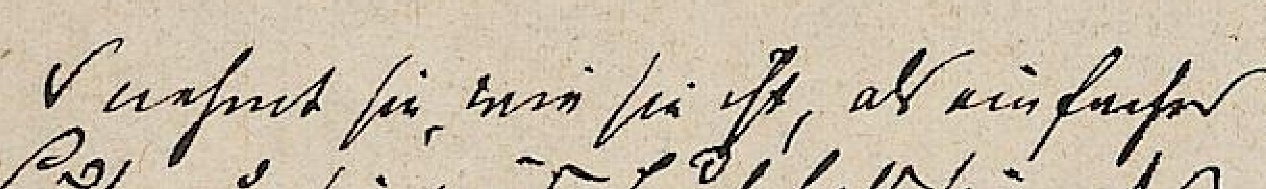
V nehmt sie, wie sie ist, als einfaches
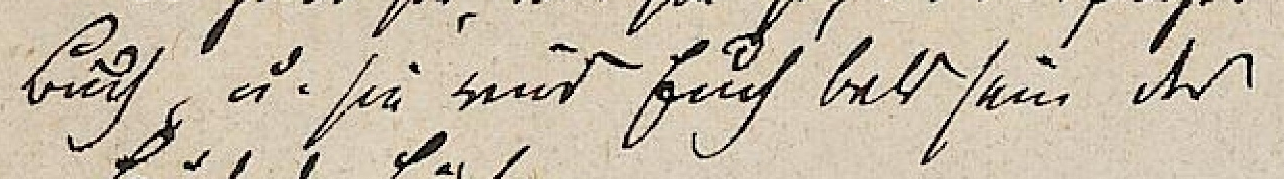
Buch, u. sie wird Euch bald sein das
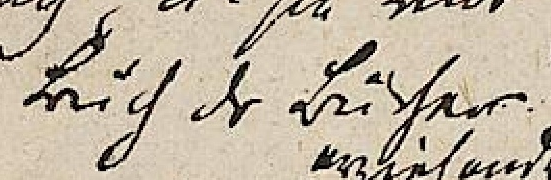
Buch dr Bücher
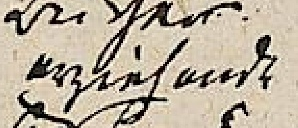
erziehnde
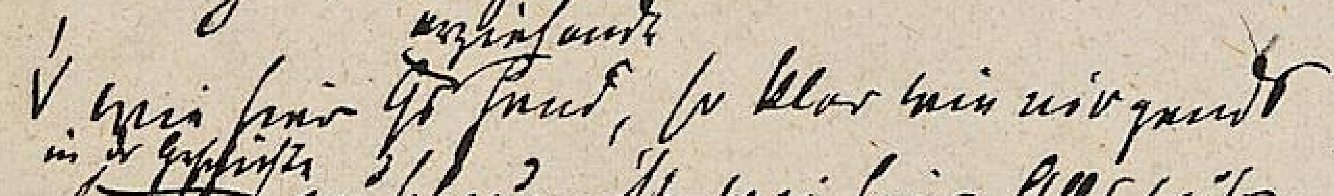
V wie hier Gs Hand, so klar wie nirgends
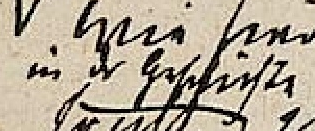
in der Geschichte
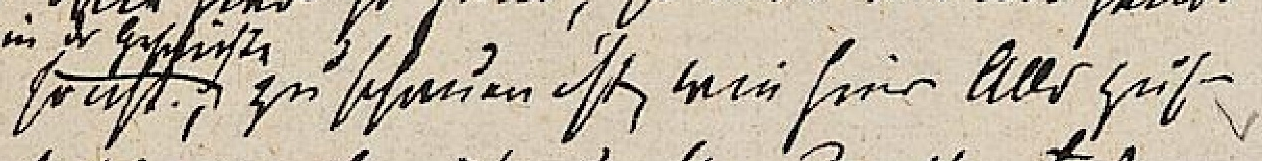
sonst zu schauen ist, wie hier Alles zus¬
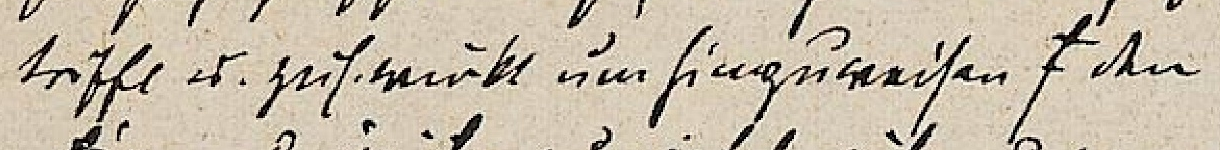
trifft u. zuswirkt um hinzuweisen f den
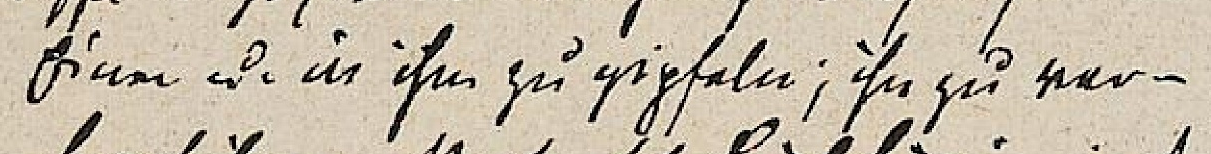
Einen u. in ihm zu gipfeln, ihn zu ver¬
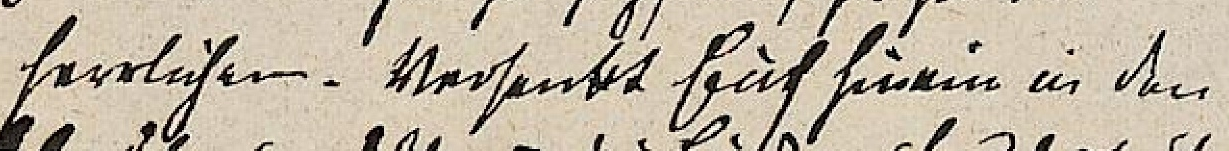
herlichen. Versenkt Euch hinein in den
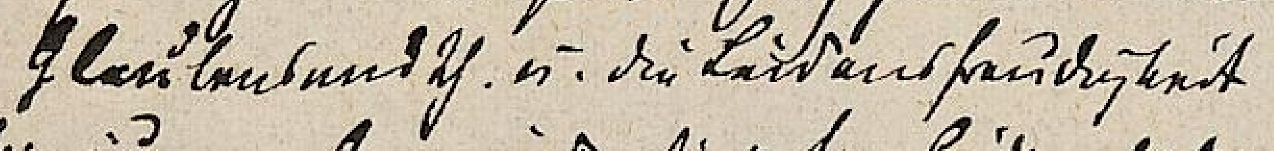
Glaubensmuth. u. die Leidensfreudigkeit
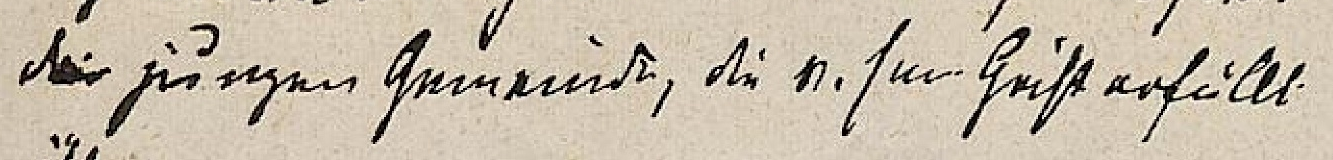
der jungen Gemeinde, die v. sm Geist erfüllt
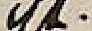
ist.
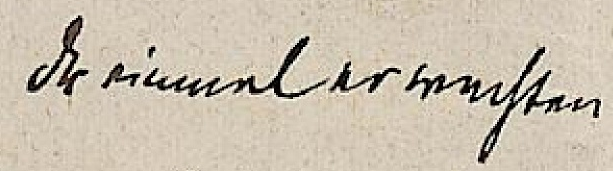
dr einmal erwachten
